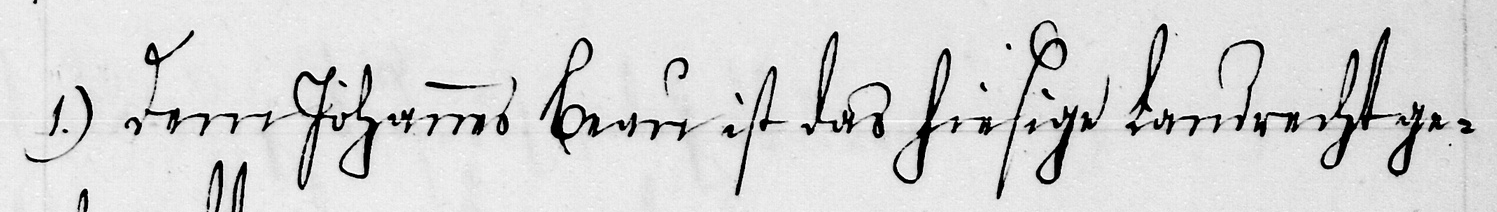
1.) Dem Johannes Beau ist das hiesige Landrecht ge¬
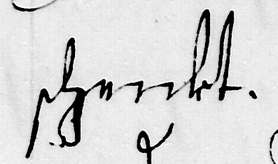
schenkt.
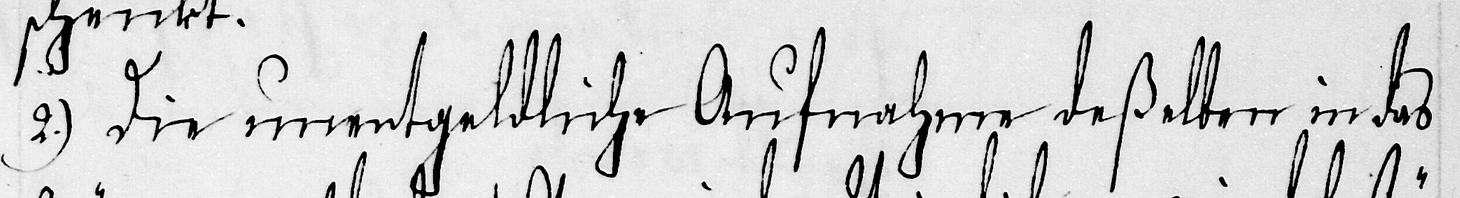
2.) Die unentgeldliche Aufnahme deßelben in das
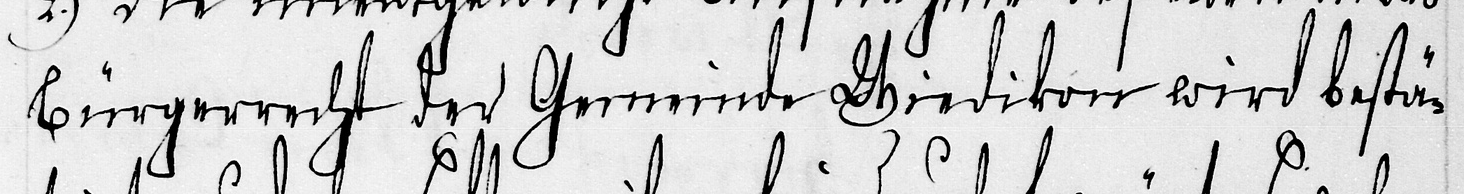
Bürgerrecht der Gemeinde Wiedikon wird bestä¬
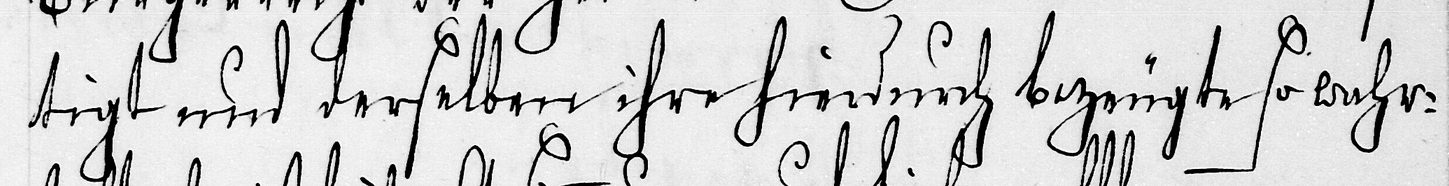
tigt und derselben ihre hierdurch bezeugte so wahr¬
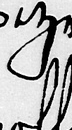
de.
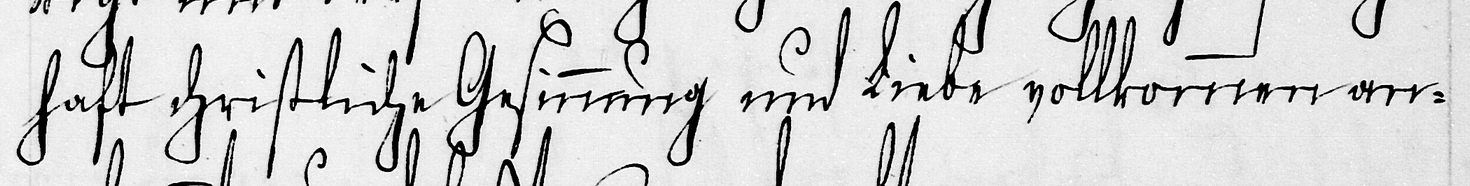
haft christliche Gesinnung und Liebe vollkommen an¬
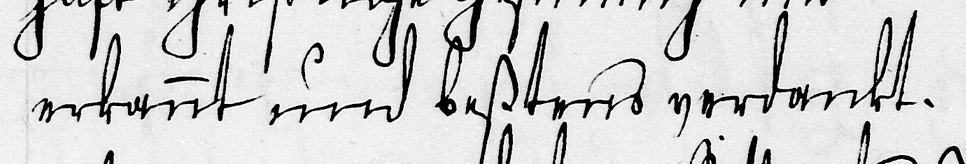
erkannt und bestens verdankt.
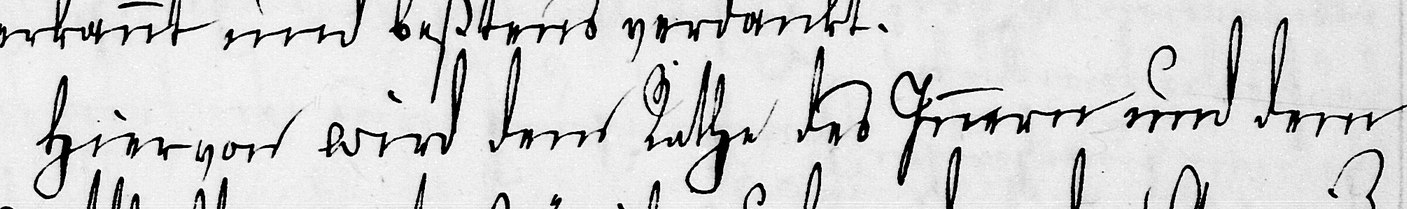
Hiervon wird dem Rathe des Innern und dem
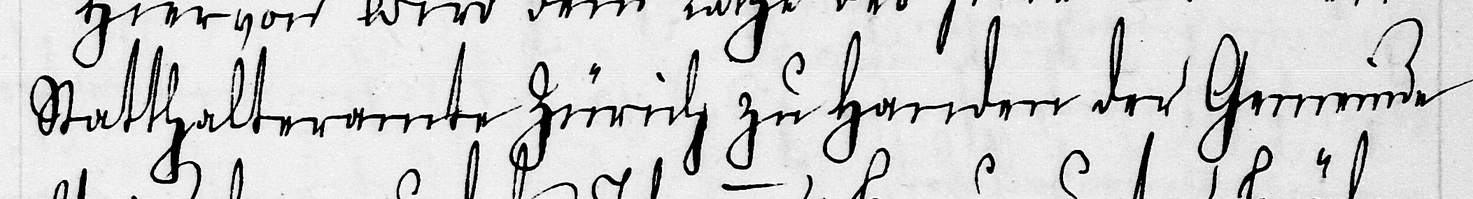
Statthalteramte Zürich zu Handen der Gemeinde
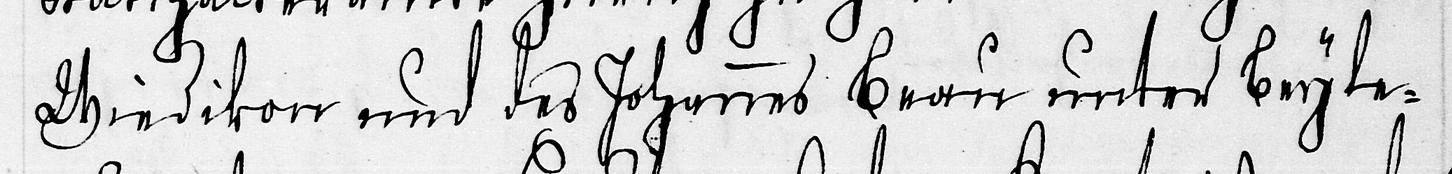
Wiedikon und des Johannes Beau unter Beyle¬
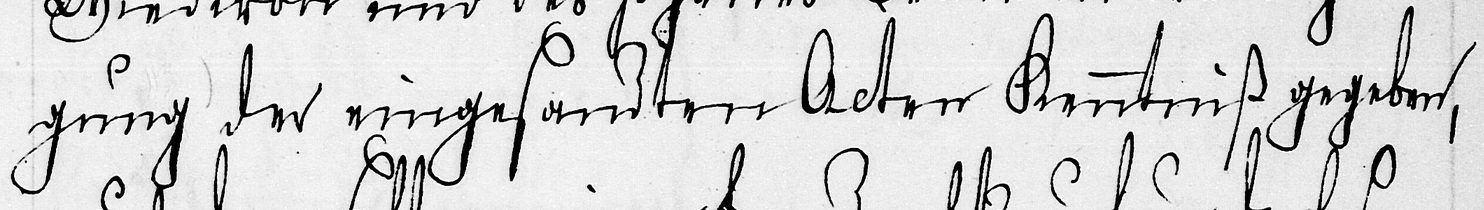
gung der eingesandten Acten Kenntniß gegeben,
